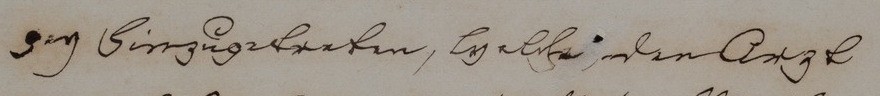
ges hinzugetreten, welche den Arzt
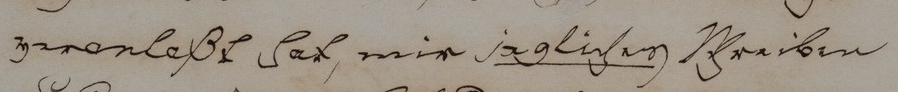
veranlaßt hat, mir jegliches Schreiben
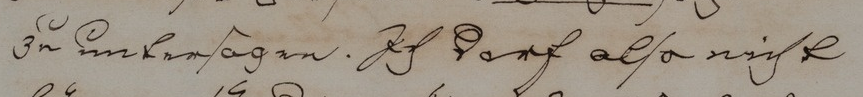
zu untersagen. Ich darf also nicht
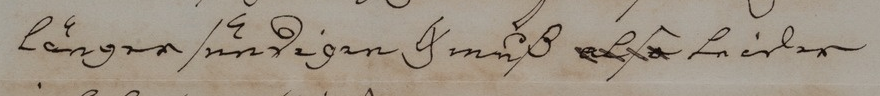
länger sündigen & muß also leider
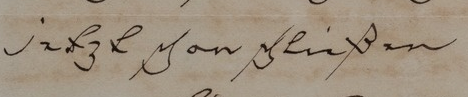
jetzt schon schließen.
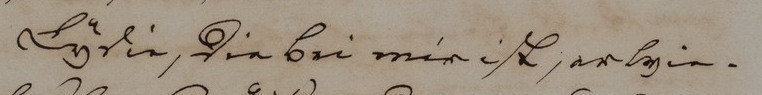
Lydie, die bei mir ist, erwie-
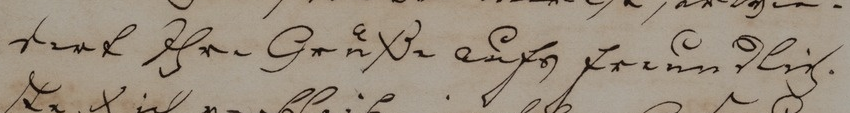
dert Ihre Grüße aufs freundlich-
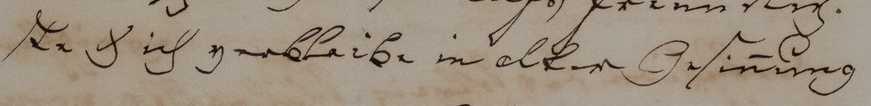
ste & ich verbleibe in alter Gesinnung
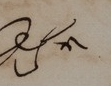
Ihr
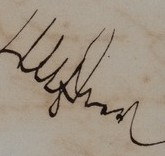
Escher
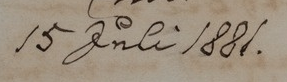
15 Juli 1881.
